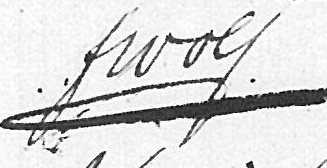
FWolf
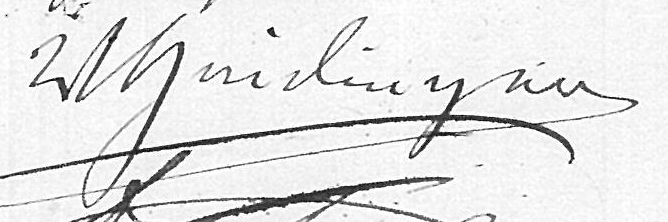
WHaidinger
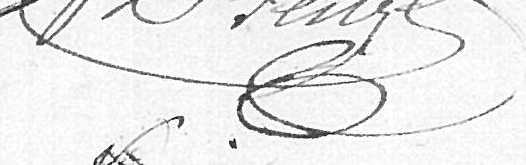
Ed Fenzl
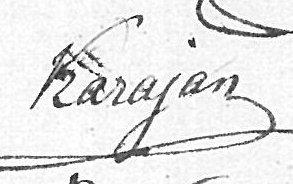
Karajan
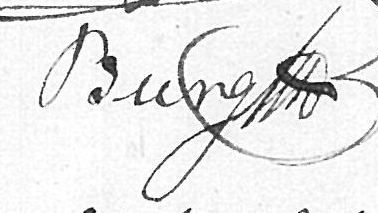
Burg
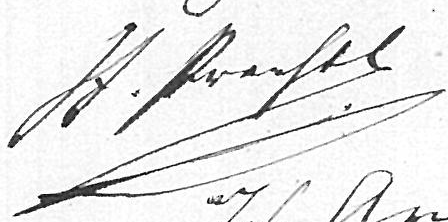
JJ Prechtl
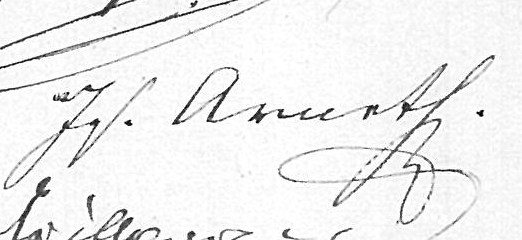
Jos. Arneth
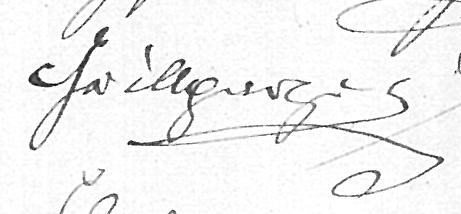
Grillparzer
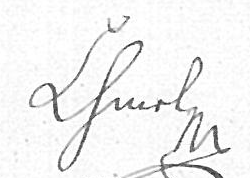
Chmel
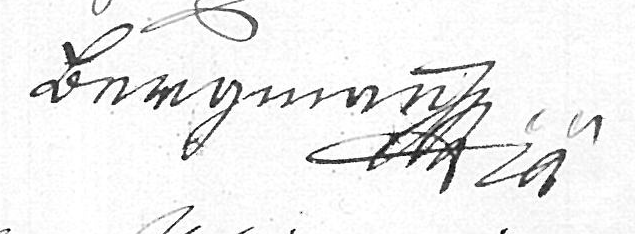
Bergmann
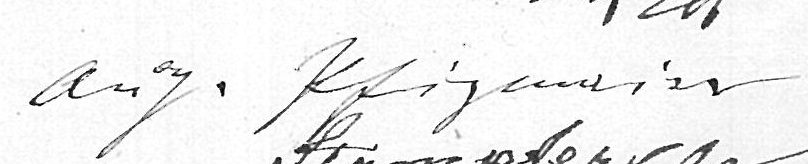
Aug. Pfizmaier
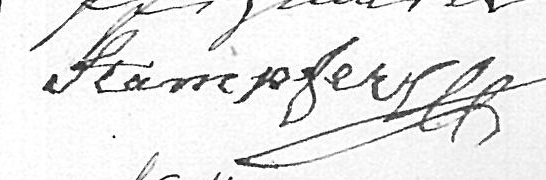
Stampfer
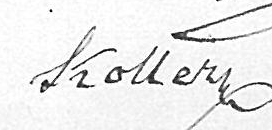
Koller
